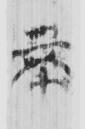不
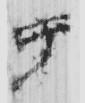于
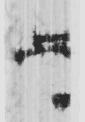上
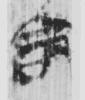命
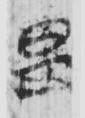是
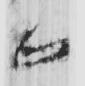㠯（以）
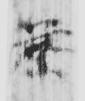不
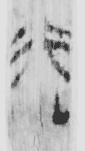行
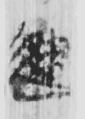進
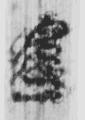退
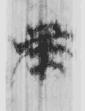不
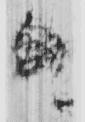{旨力}
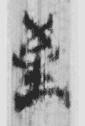至
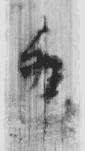力
